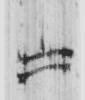士
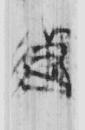﨤
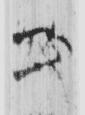攻
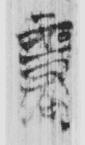商
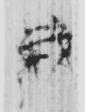戎
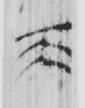夫
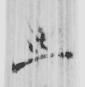之
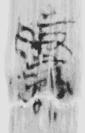{阜圭㕛心}
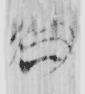於
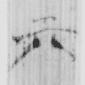亓
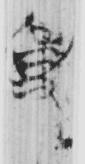事
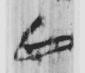㠯（以）
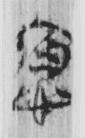愈
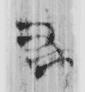求
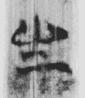生
